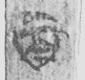百
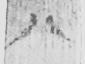八
